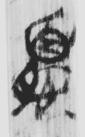{月頁心}
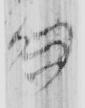於
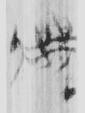俴
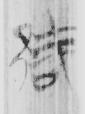唯
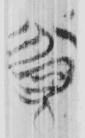貧
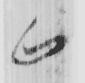㠯（以）
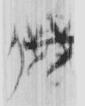俴
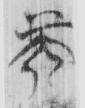而
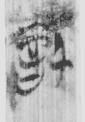信
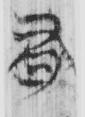有
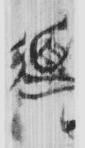道
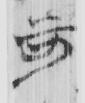可
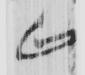㠯（以）
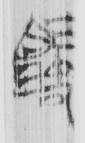{馬午又}
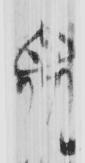眾
